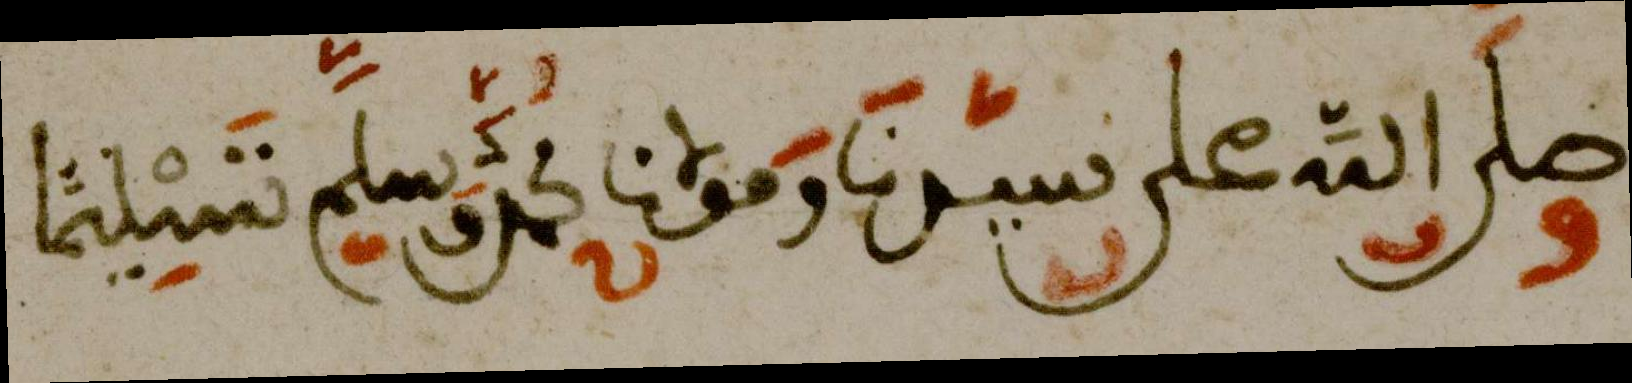صلى الله على سيّدنا ومولانا محمّد وسلّم تسليما
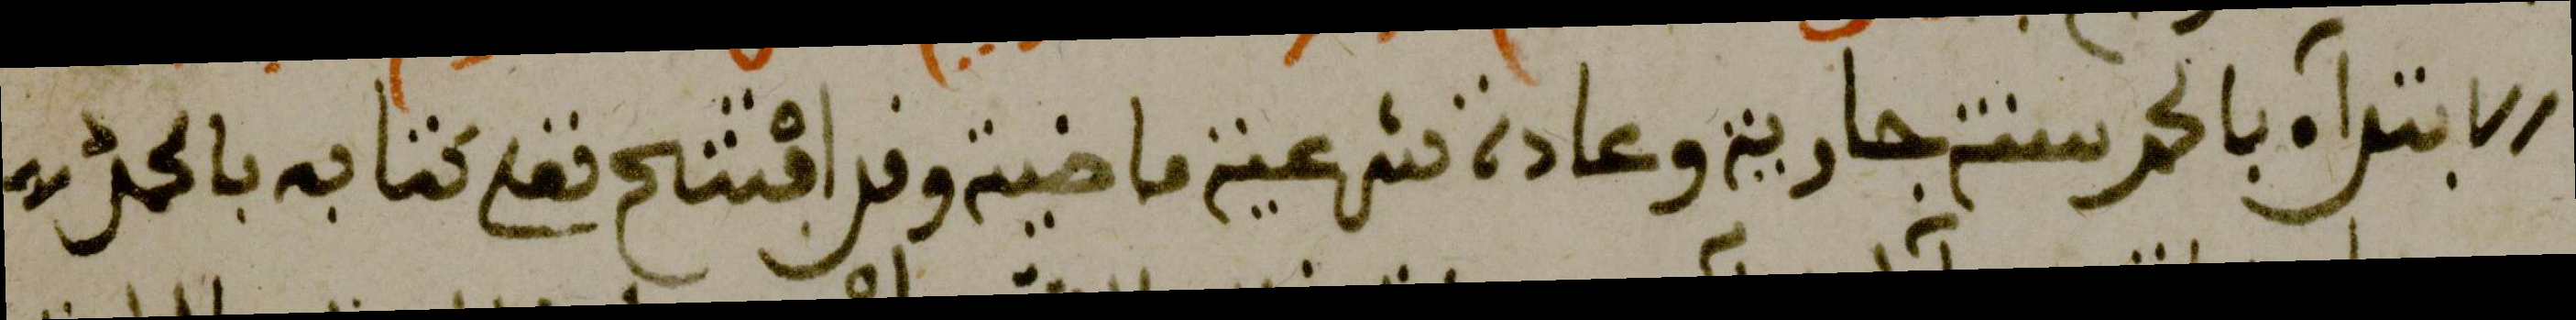الابتداء بالحمد سنة جارية و عادة شرعية ماضية وقد افتتح تعلى كتابه بالحمد
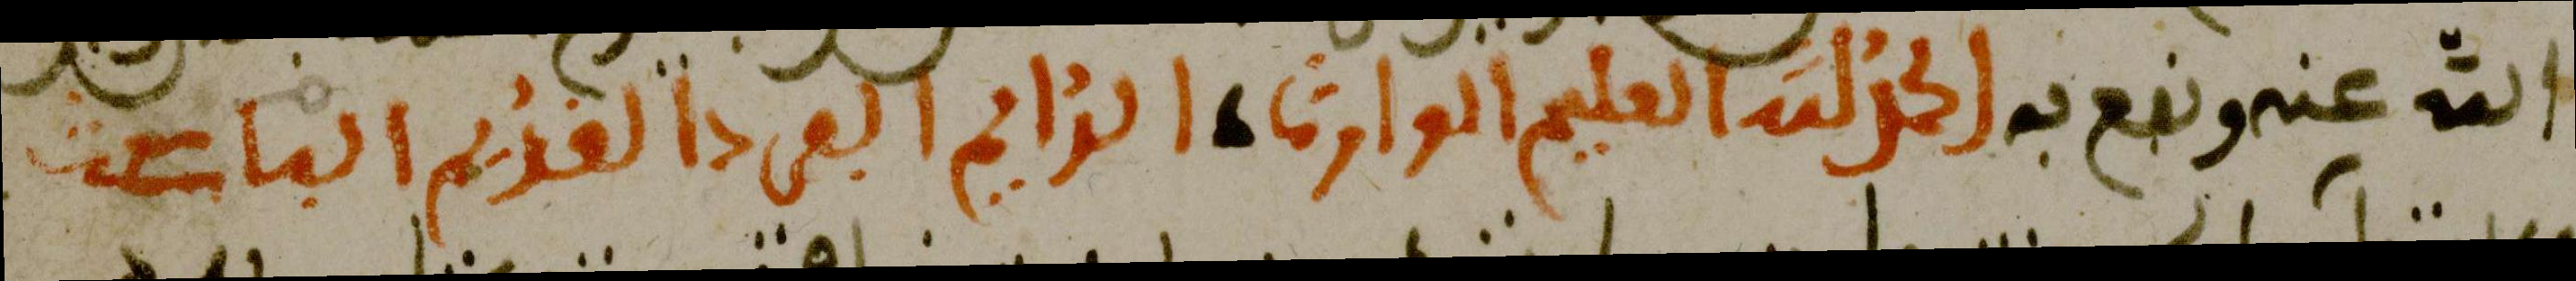الله عنه ونفع به الحمد لله العليم الوارث الدّايم الفرد القديم الباعث
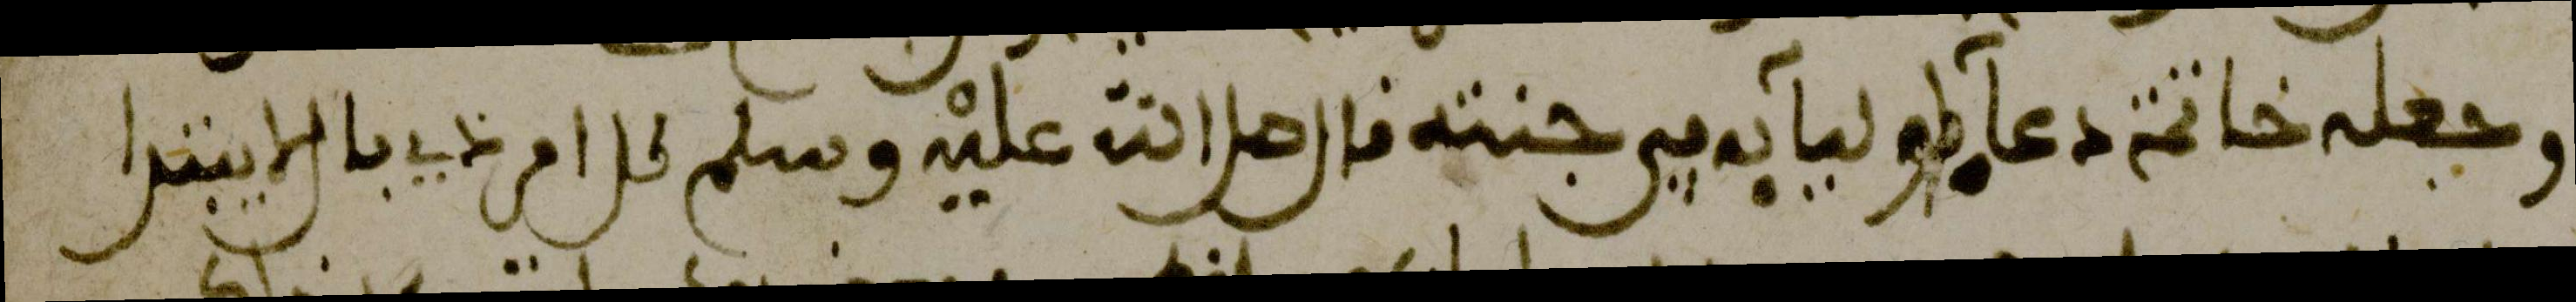وجعله خاتمة دعاء او ليائه في جنته قال صل الله عليه وسلم كل امر ذي بال لا يبتدا
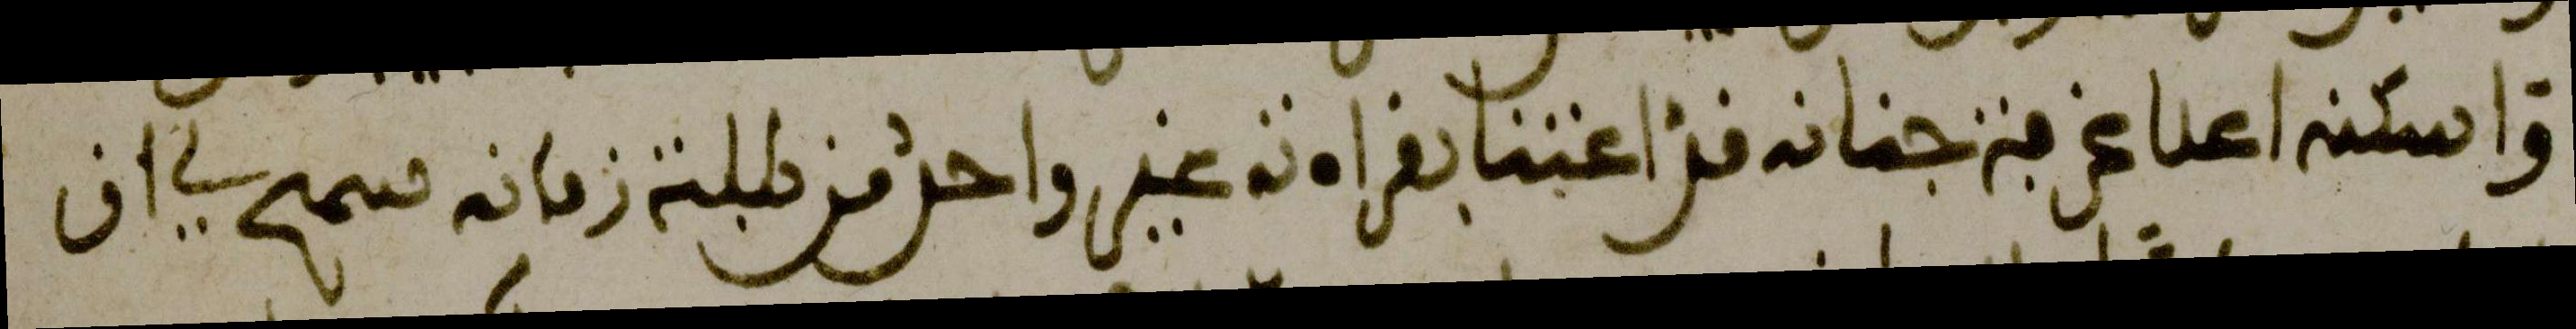واسكنه اعلا غرفة جنانه فد اعتنا بقراءته غير واحد من طلبة زمانه سمح لي ان
